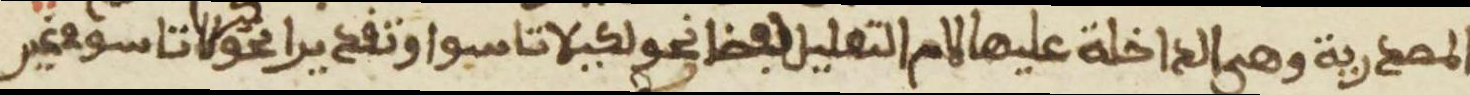المصدرية و هي الداخلة عليها لام التعليل لفظا نحو لكيلا تاسوا و تقديرا نحو لا تاسو في غير
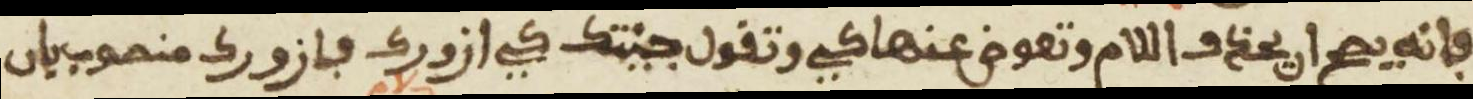فانه يصح ان يحذف اللام و تعوض عنها كي و تقول جئتك كي ازورك فازورك منصوب بان
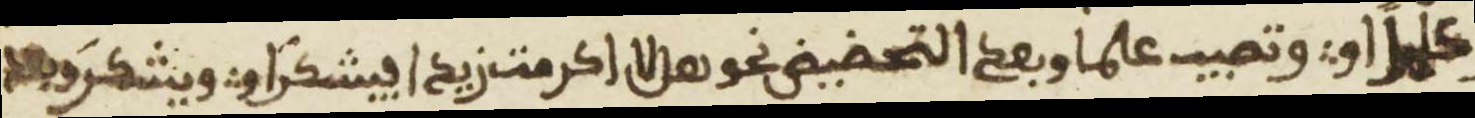علما او و تصيب علما و بعد التحضيض نحو هل لا اكرمت زيدا فيشكر او و يشكر و بعد
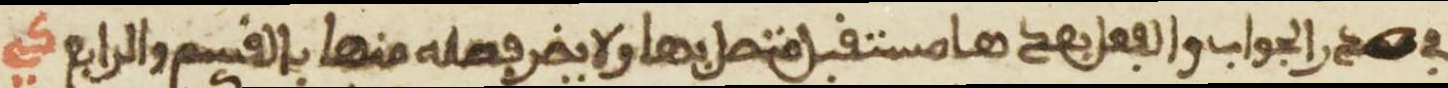في صدر الجواب و الفعل بعدها مستقبل متصل بها و لا يضر فصله منها بالقسم و الربع كي
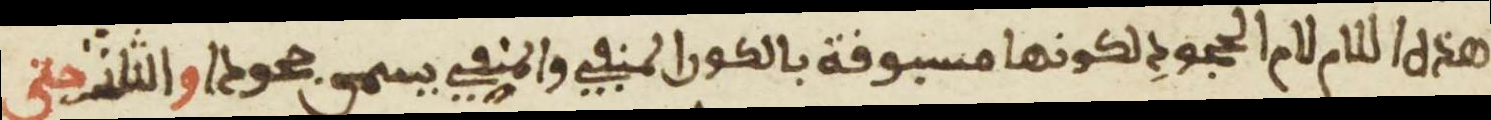هذه اللام لام الجحود لكونها مسبوقة بالكون المنفي و المنفي يسمى جحودا و الثاني حتى
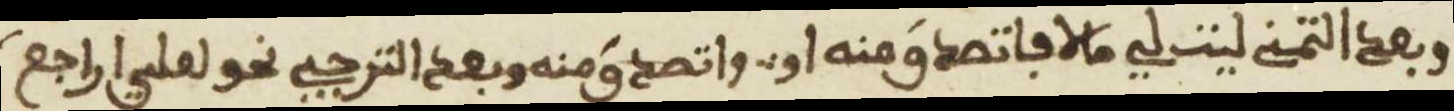و بعد التمني ليت لي مالا فاتصدق منه او و اتصدق منه و بعد الترجي نحو لعلي اراجع
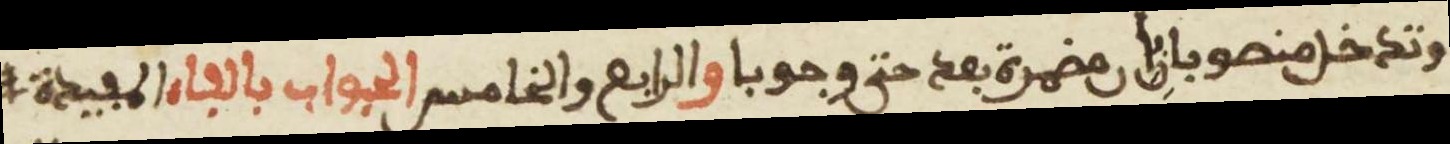و تدخل منصوبا ### مضمرة بعد حتى وجوبا و الرابع و الخامس الجواب بالفاء المفيدة
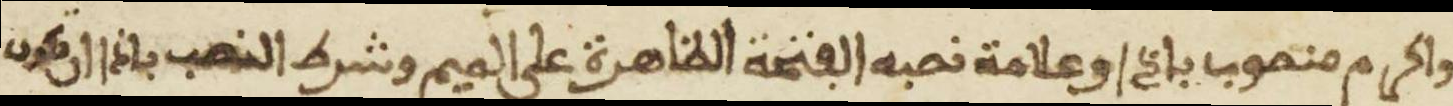و اكرم منصوب باذا و علامة نصبه الفتحة الظاهرة على الميم و شرط النصب باذا ان تكون
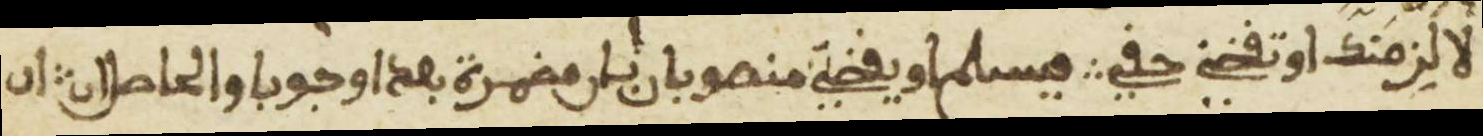لالزمنك او تقضني حقي فيسلم او يقضي منصوبان بان مضمرة بعد او وجوبا و الحاصل ان ان
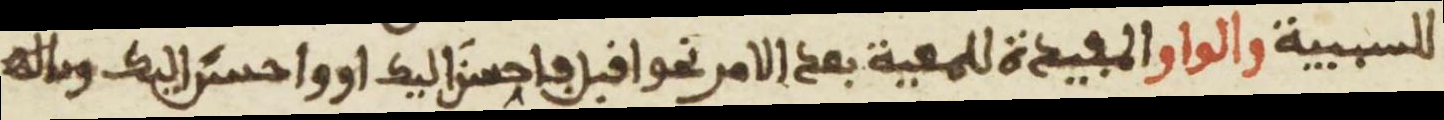للسببية و الواو المفيدة للمعية بعد الامر نحو اقبل فاحسن اليك او و احسن اليك و
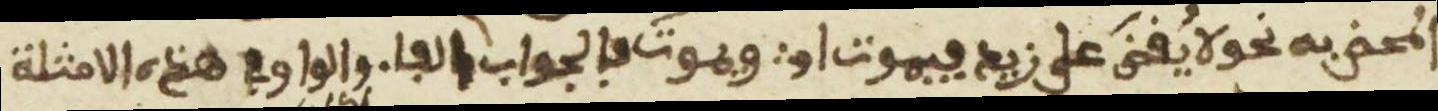المحض به نحو لا يقض على زيد فيموت او و يموت فالجواب الفاء و الواو و في هذه الامثلة
